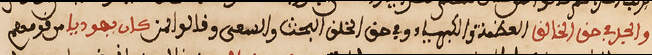الجد في حق الخالق العظمة والكبرياء وفي حق الخلق البحث والسعدى وقالوا لمن كان يهوديا من قومهم
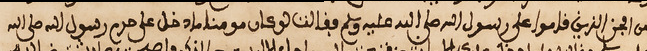من الجن الذين قدموا على رسول الله صلى الله عليه وسلم فقالت لو كان مومنا ما دخل على حرم رسول الله صلى الله
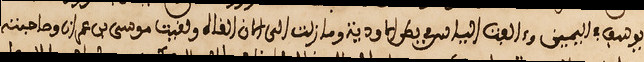يوسف في اليمين وءلفت الياس في بطن الاودية ومازلت الى الان القاه ولقيت موسم بن عمران وصاحبته
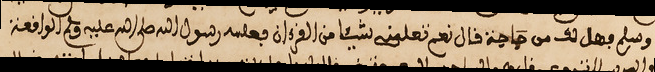وسلم فهل لك من حَاجة قال نعم تعلمنى شيئا من القرءان فعلمه رسول الله صلى الله عليه وسلم الواقعة
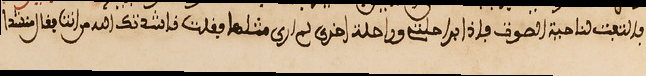فالتفت لناحية الصوت فاذا براحلتى وراحلة اخرى لم ارى مثلها فقلت ناشدتك الله من انت فقال منشدا
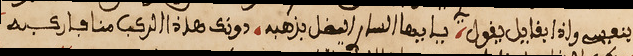بنفسى واذا بقايل يقول يا يها السارى المضل بذهبه دونك هاذا الركب منا فاركبه
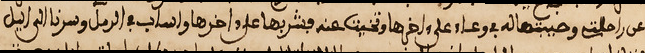عن راحلتى وصيبتها له في وعاء على ءاخرها وتنحيت عنه فشربها على ءاخرها واىساب في الرمل وسرنا الى اليل
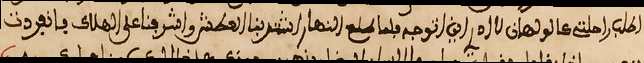اطلب راحلتى كالولهان لا ادري اين اتوجه فلما طلع النهارر اشتربنا العطش واشرفنا على الهلاك فانفردت
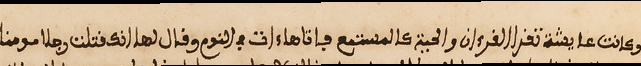وكانت عايشة تقرا القرءان والحية كالمستمع فاتاها ءات في النوم وثال لها انك قتلت وجلا مومنا
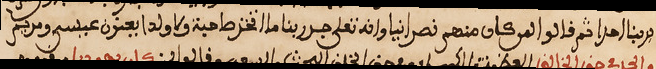بربنا احدا ثم قالوا لمن كان منهم نصرانيا وانه تعلى جد ربنا ما اتخذ صاحبة ولا ولدا يعنون عيسى ومريم
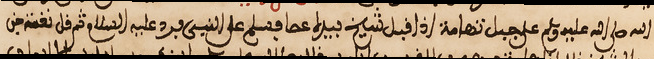الله صلى الله عليه وسلم على جبل تهامة اذا اقبل شيخ بيه عصا فسلم على النبى فرد عليه السلام ثم قل نغمة جن
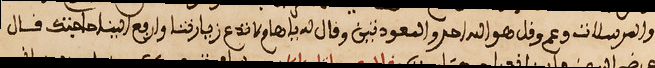والمرسلات وعم وقل هو الله احدد والمعودتين وقال له يا هام لا تدع زيارتنا وافع الينا صاحبتك قال
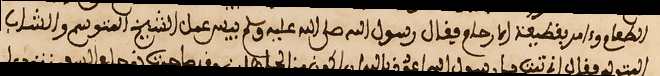الطعام وءامر بقطيعة الارحام فقال رسول الله صلى الله عليه وسلم بيس عمل الشيخ المتوسم والشاب
